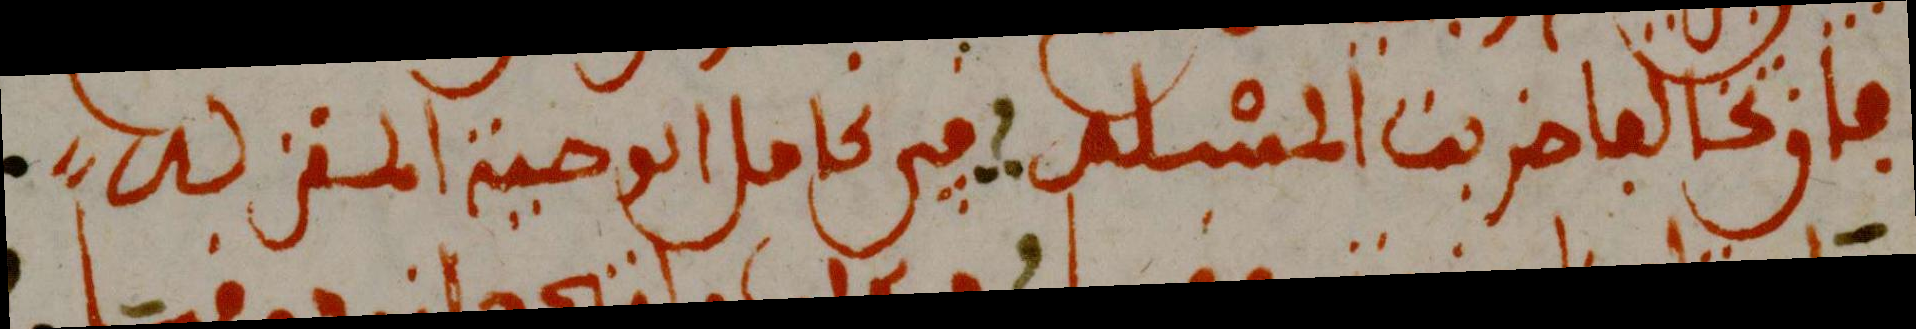فان تخا الفا ضربت المسله في كامل الوصية المنزله
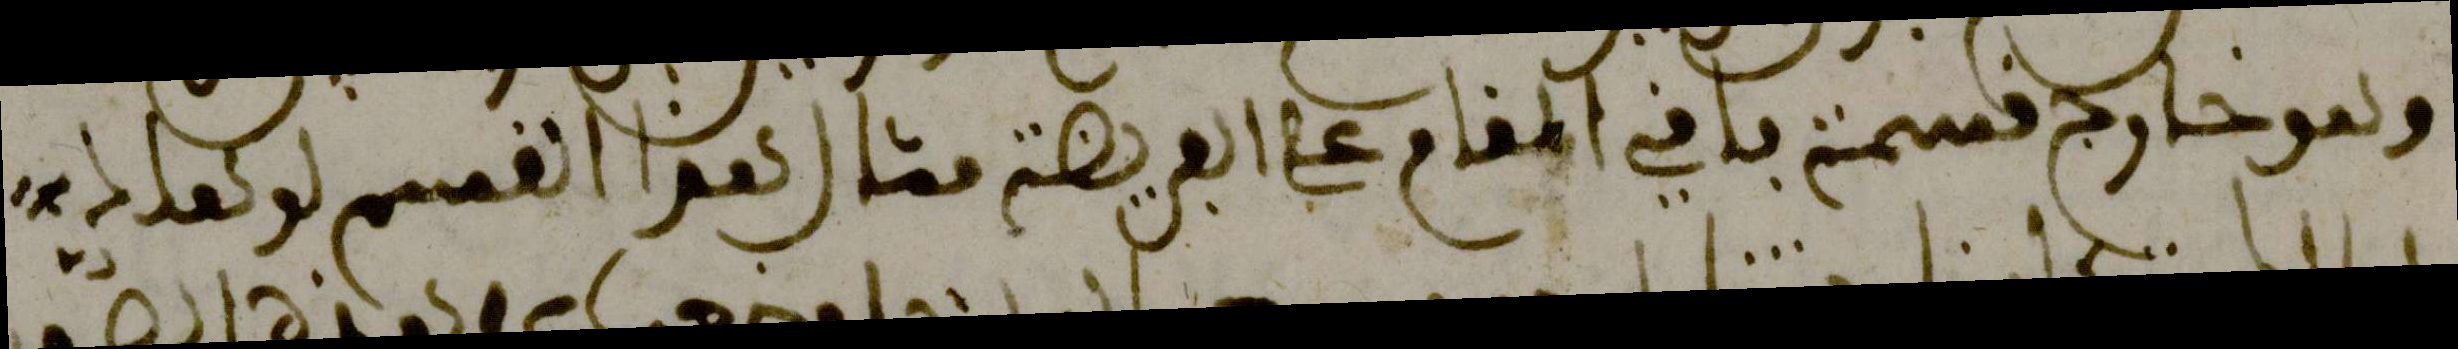وهو خارج قسمة باقي المقام على الفريضة مثال هذا القسم لو هلك
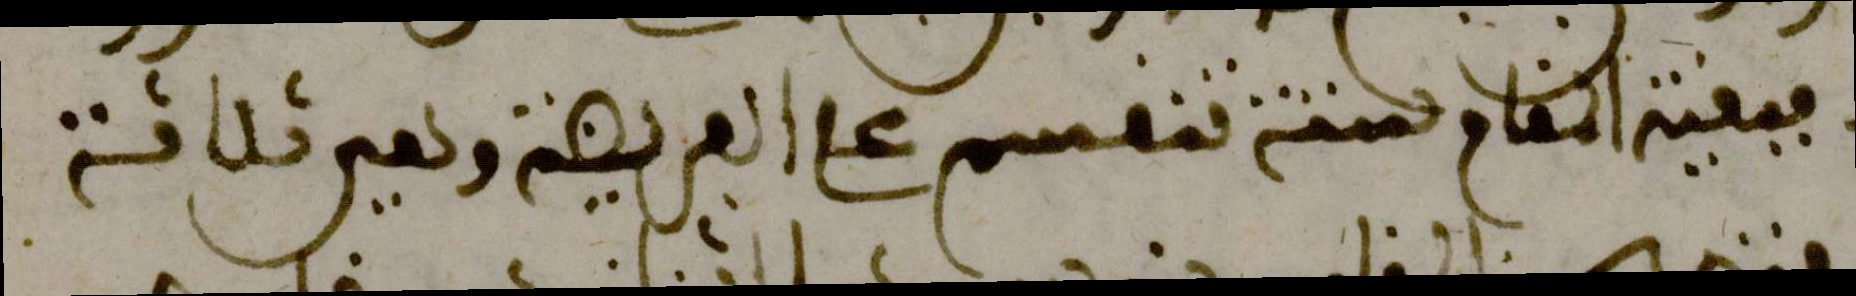قبفية المقام ستة تنقسم على الفريضة وهي ثلاثة
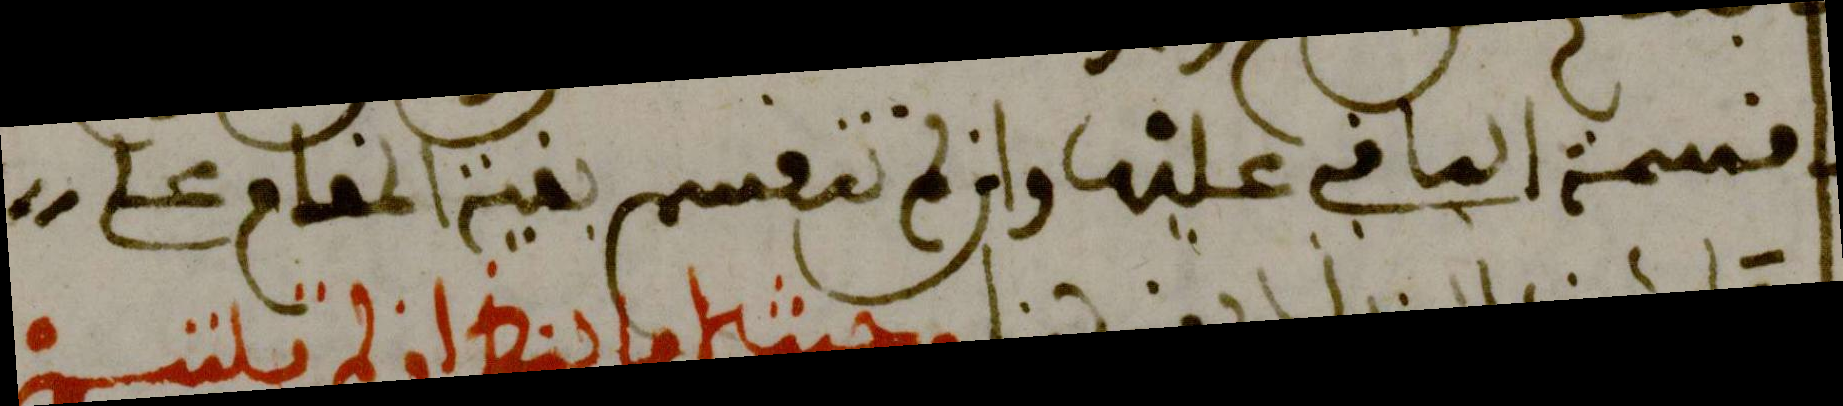قسمة الباقي عليها وان لم تنقسم بقية المقام على
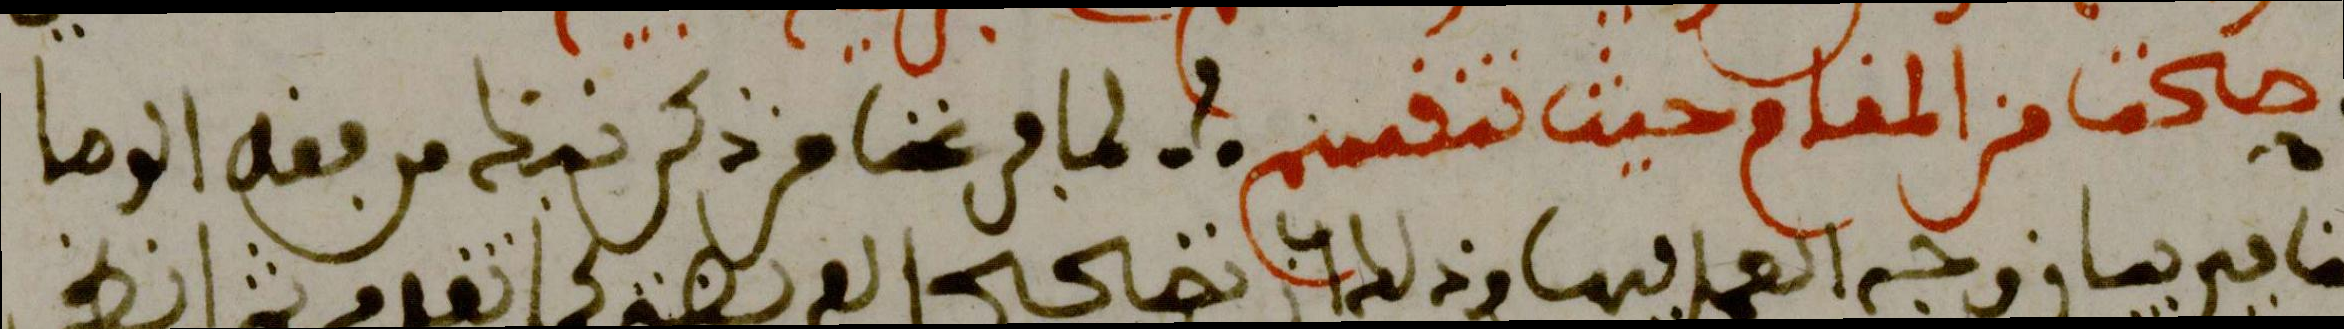صحت من المقام حيث تنقسم لما فرغنا من ذكر نبذ من فقه الوصا
